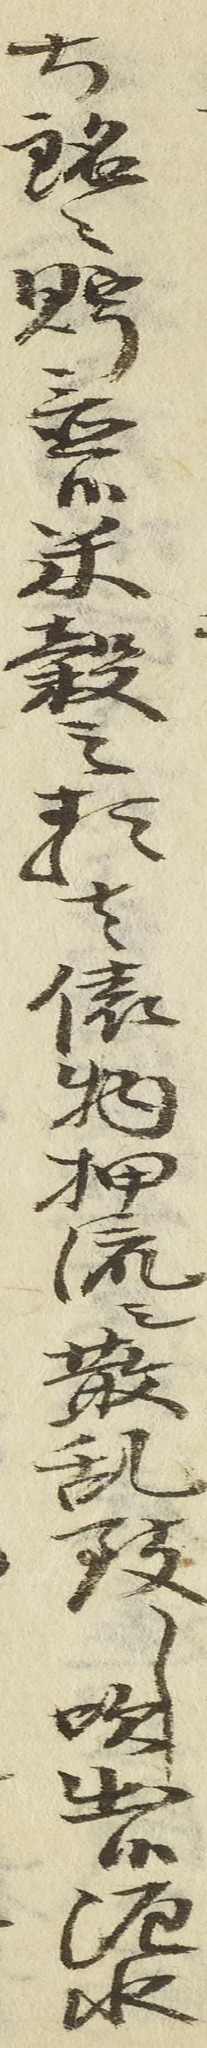ち銘々貯置候米穀之類は俵物押流ㇱ散乱致し吹出候泥水
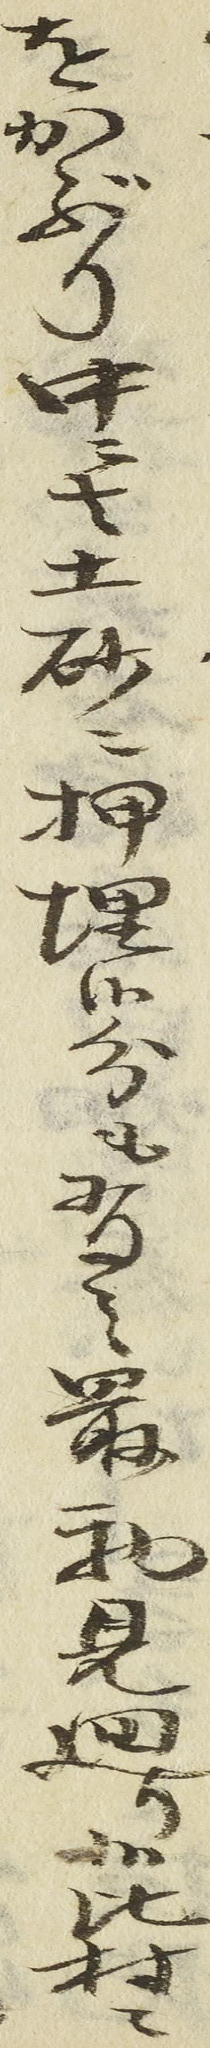をかぶり中二は土砂二押埋候分も有之,最初見廻り候比村々
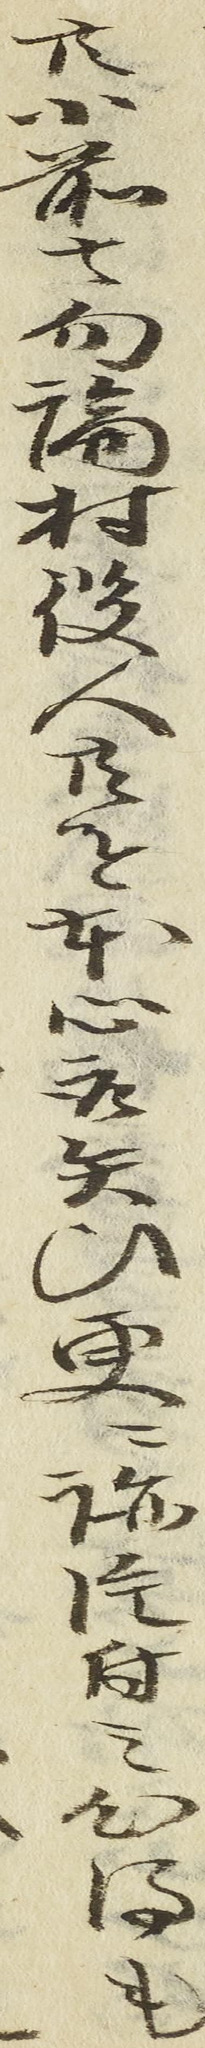共小前は勿論村役人共を本心取失ひ更二跡片付之心得も
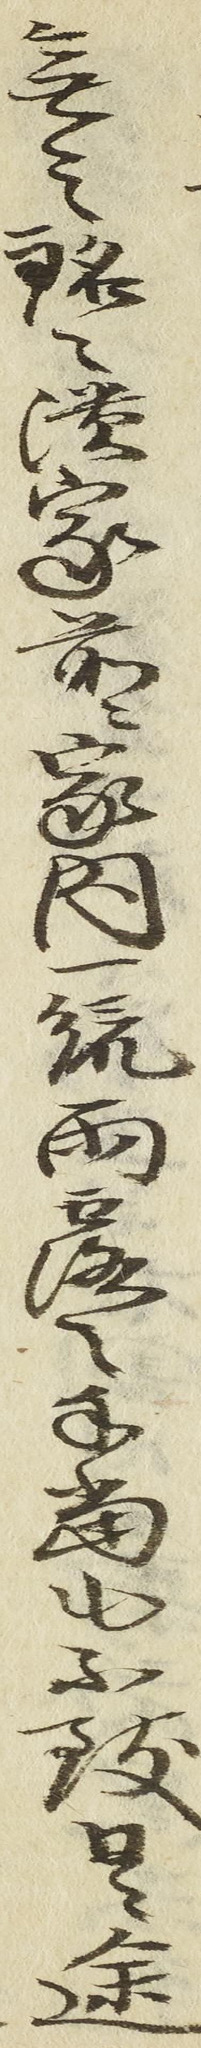無之銘々潰家前二家内一統雨露之手当も不致只々途
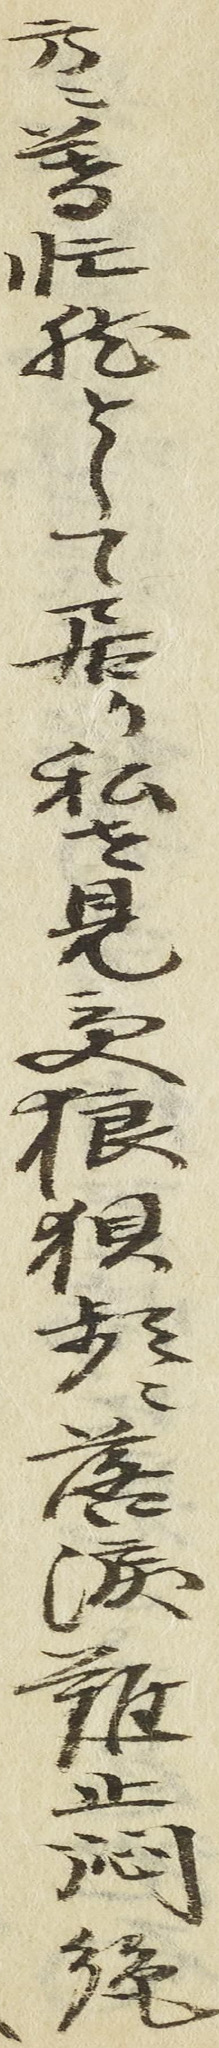方二暮茫然として居り私を見受狼狽頻ニ落涙難止悶絶
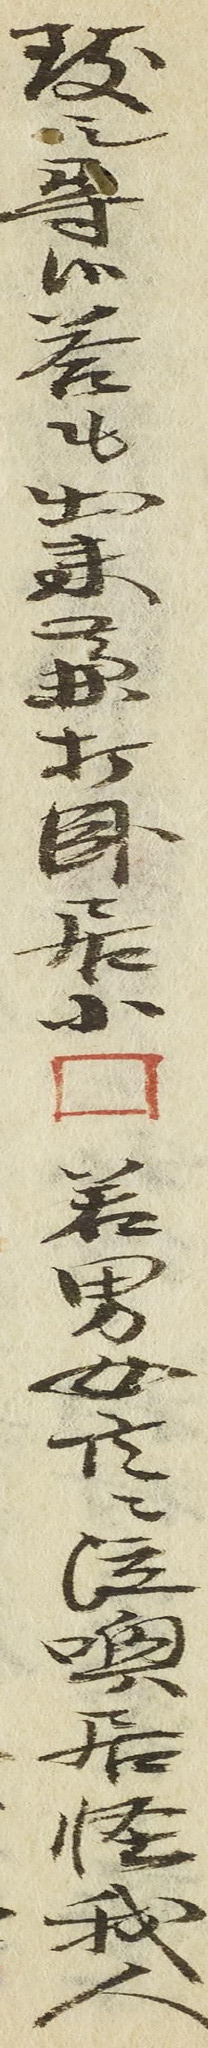致ㇱ尋候答も出来兼打臥居小口若男女共二泣喚居怪我人
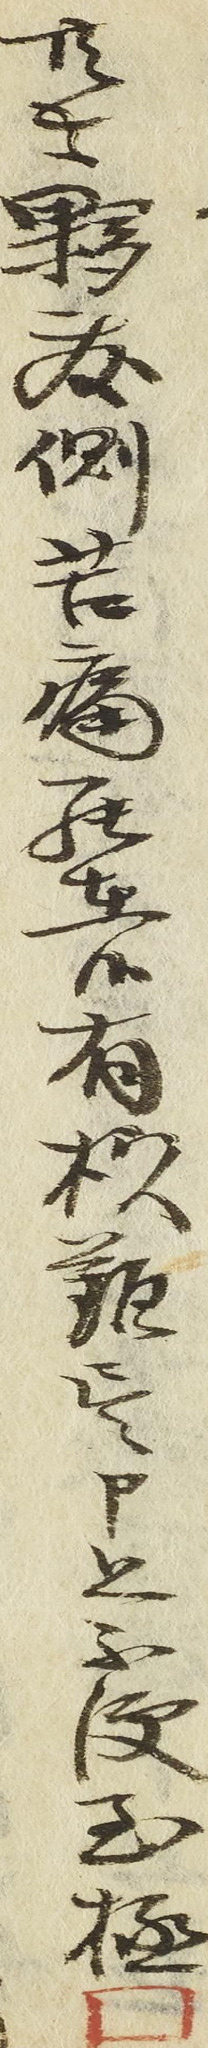共は夥敷倒苦痛罷在候有様難盡申上不便至極口
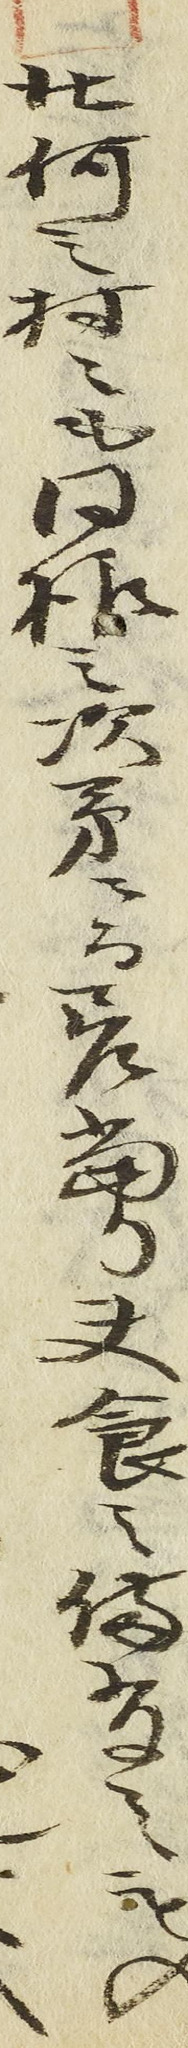口仕何之村々も同様之次第二而差当り夫食之備有之もの
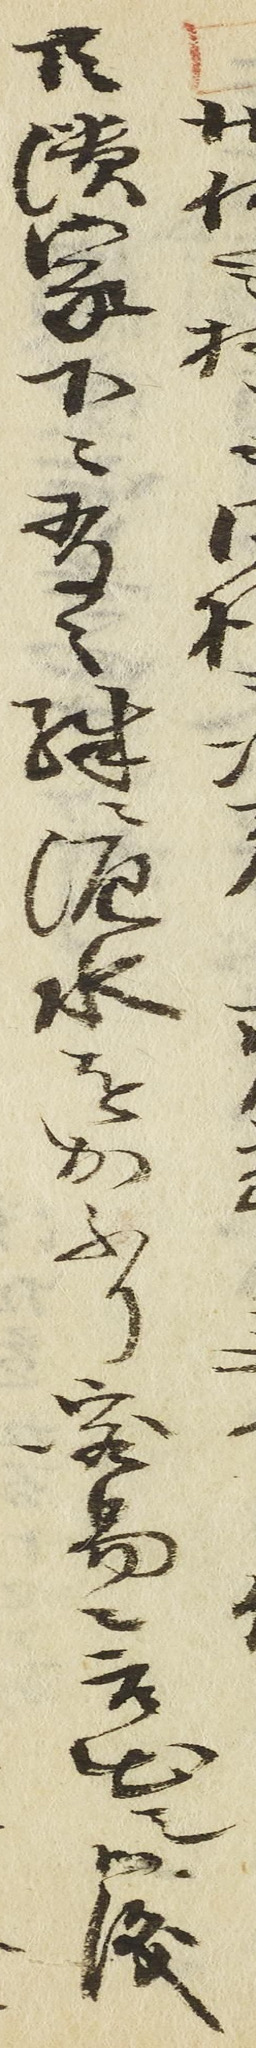共潰家下二有之殊二泥水をかふり容易二取出ㇱ候儀
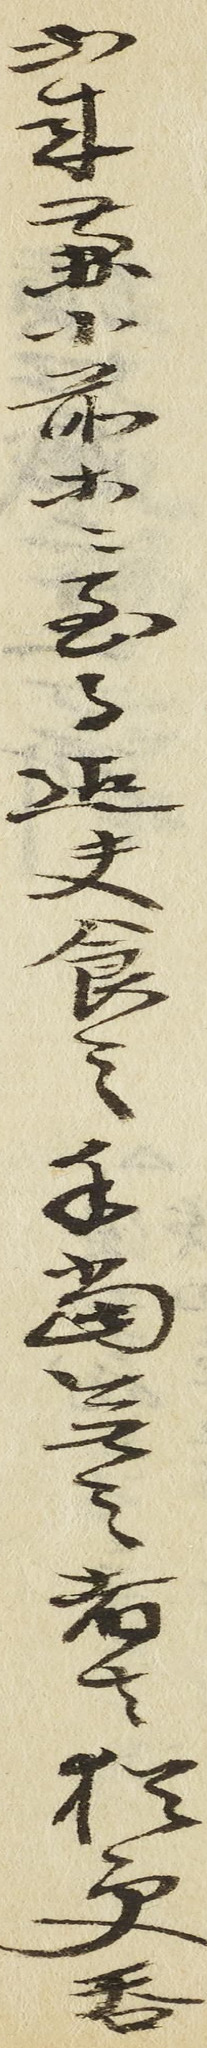出来兼小前等二至る迄夫食之手当無之者は猶更呑
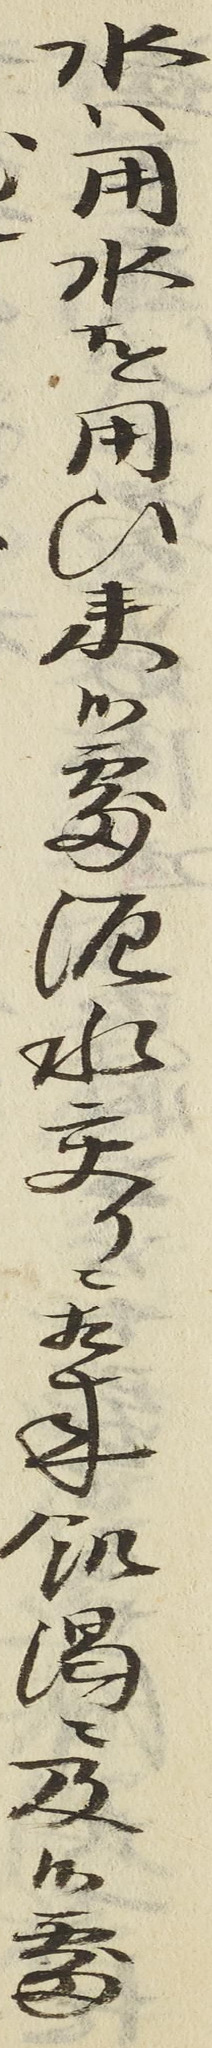水ハ用水を用ひ来候処泥水交り二相成飢渇二及候処
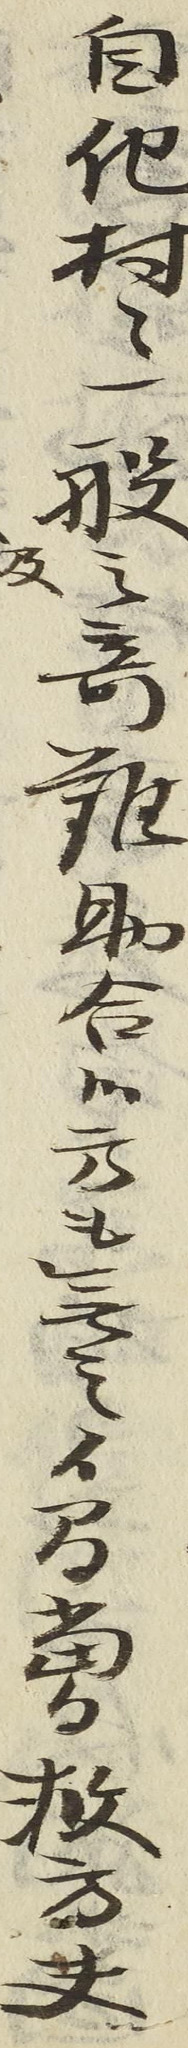自他村々一般之奇難助合候方も無之候間当日救方夫
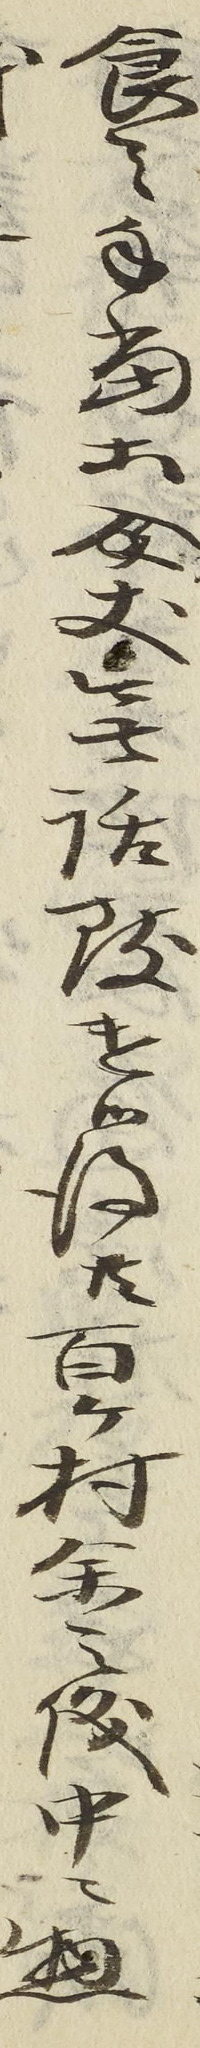食之手当等及丈無話致遣候得共百ヶ村余之儀中々惣
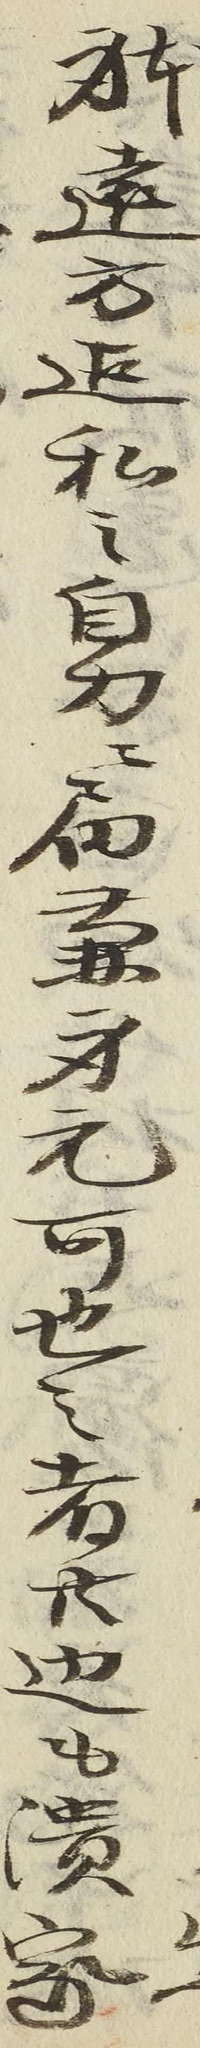体遠方迄私之自力二届兼身元可也之者辺も潰家
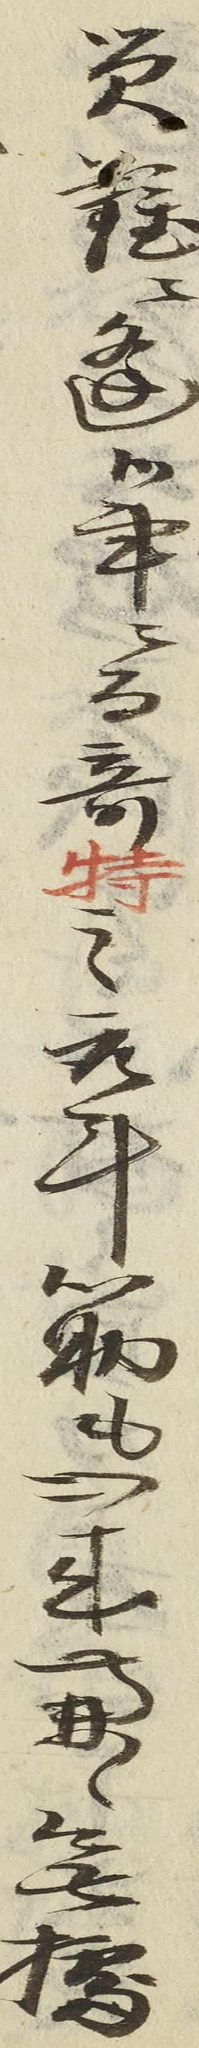災難二逢候事二而奇特之取斗筋も出来兼無拠
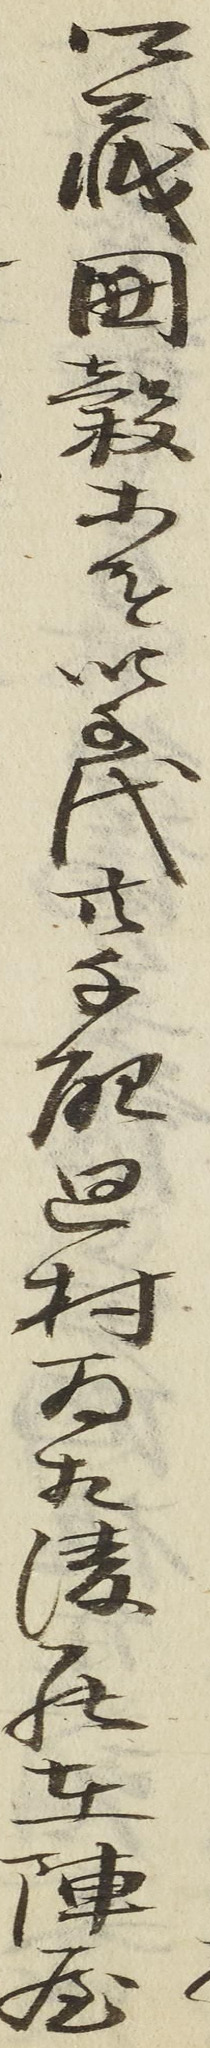郷倉囲穀等を以手代共手配廻村為相凌罷在陣屋
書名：信濃國大地震記　乾
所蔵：東京大学地震研究所図書室 Earthquake Research Institute Library, The University of Tokyo, JAPAN
